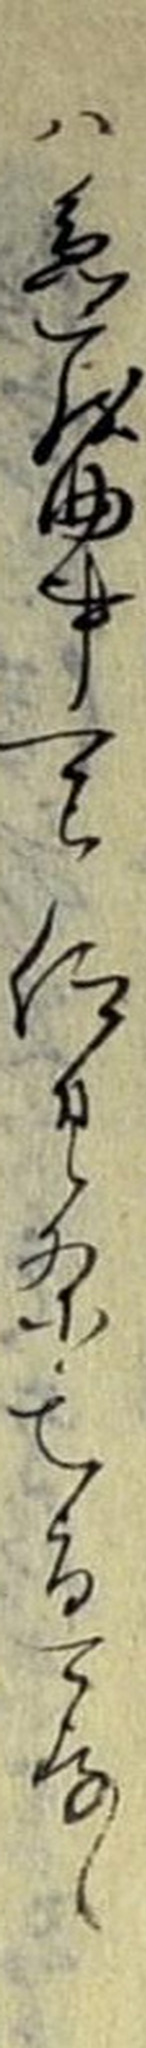は急度曲事可被仰付候条其旨可存之
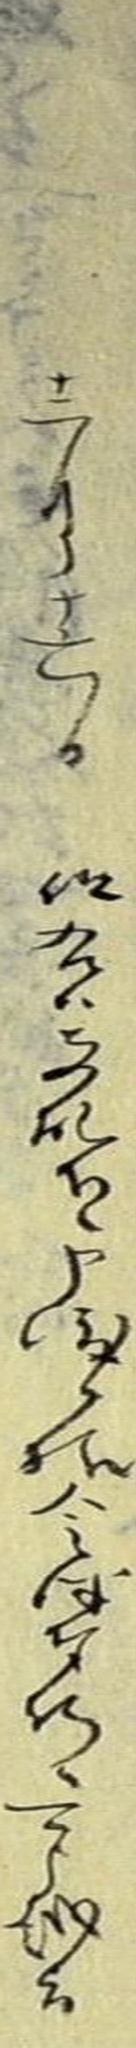十二月十六日但右は支配下へ申渡候様金津奉行へ可申趣旨

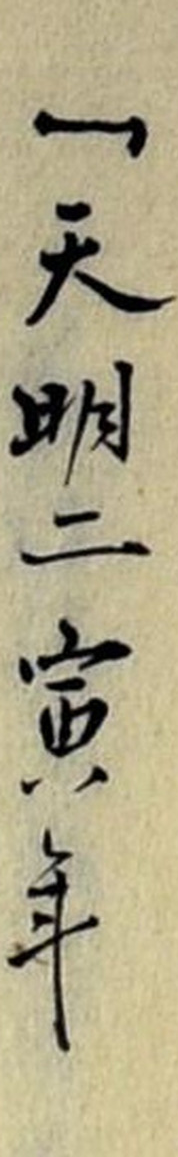一天明二寅年
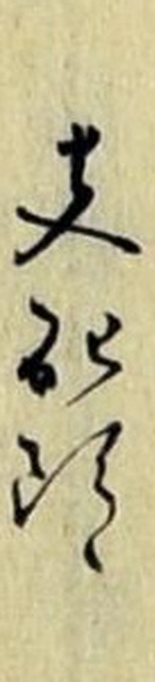支配頭へ
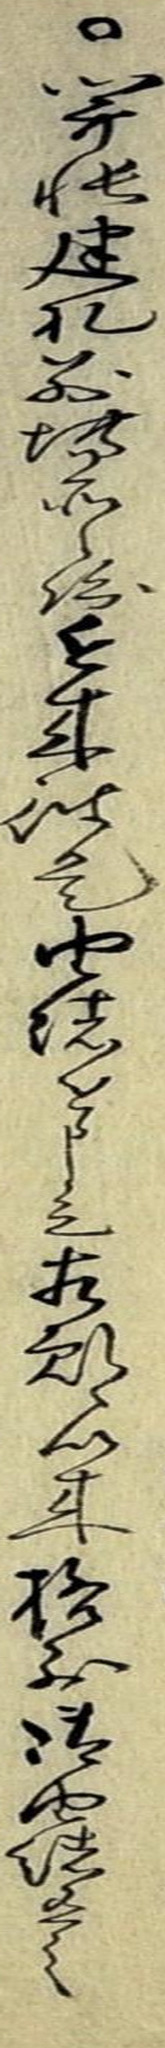〇開帳建札別場所之儀近年彼是由緒を申立相願候以来格別御由緒有之
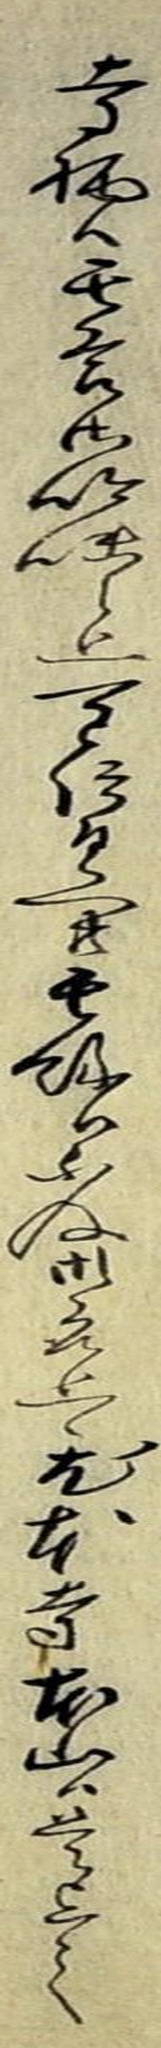寺柄は其節御吟味之上可被仰付候へ共其余は不及御取上候尤本寺本山は是迄之
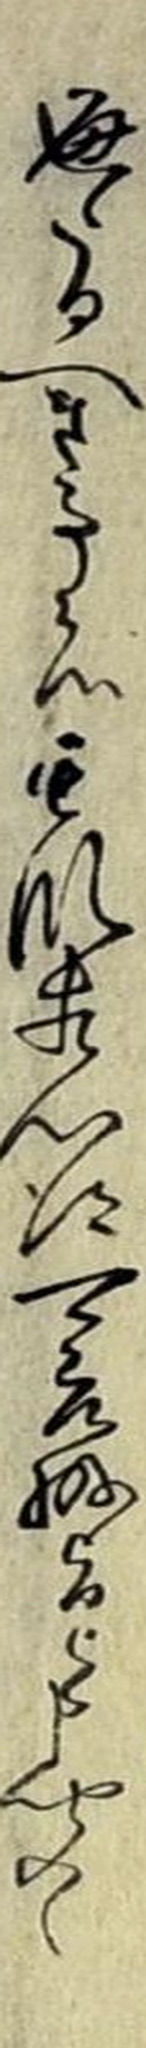通たるへき事に候其段相心得可取扱旨被申聞候
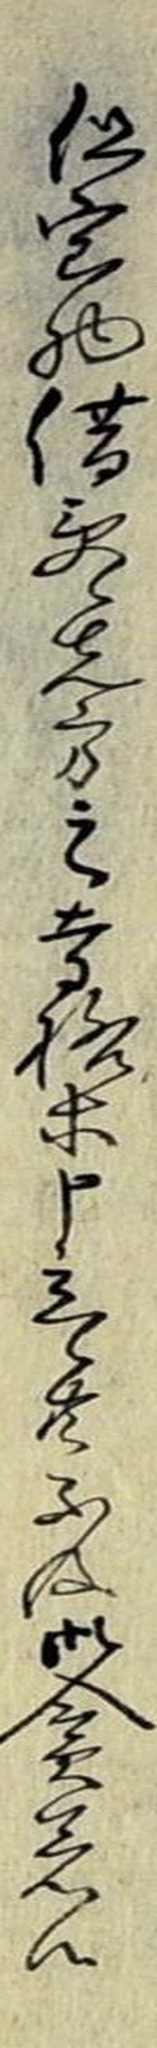但宝物借受候先方之寺格等申立候共不及御貪着候
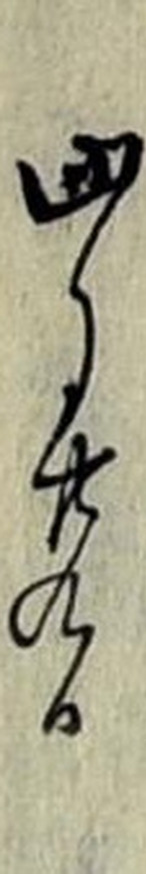四月廿九日
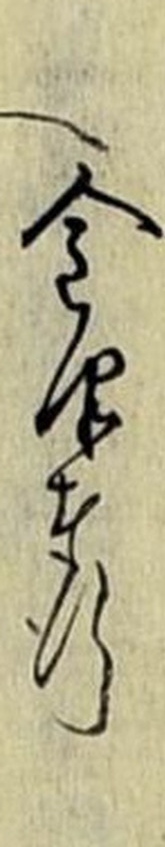金津奉行
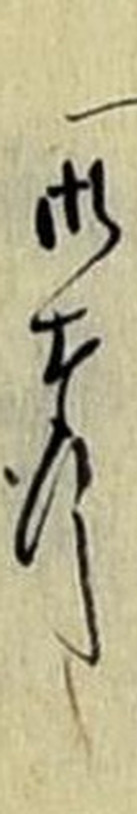御奉行
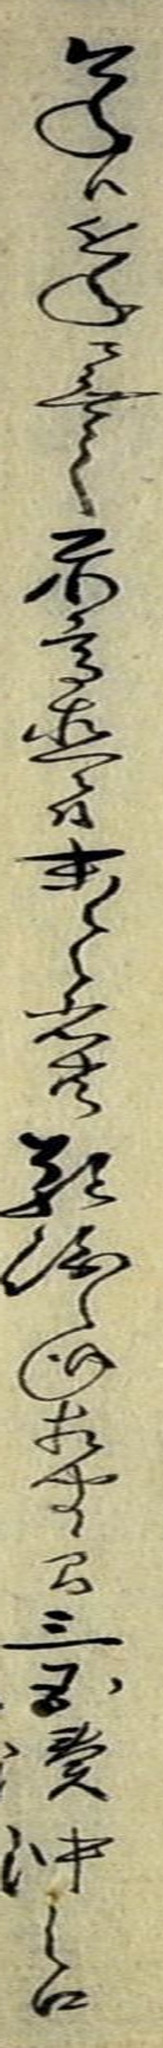〇今年は近年に無之米高直に付末々之者共難儀之趣相聞候間三国湊沖之口
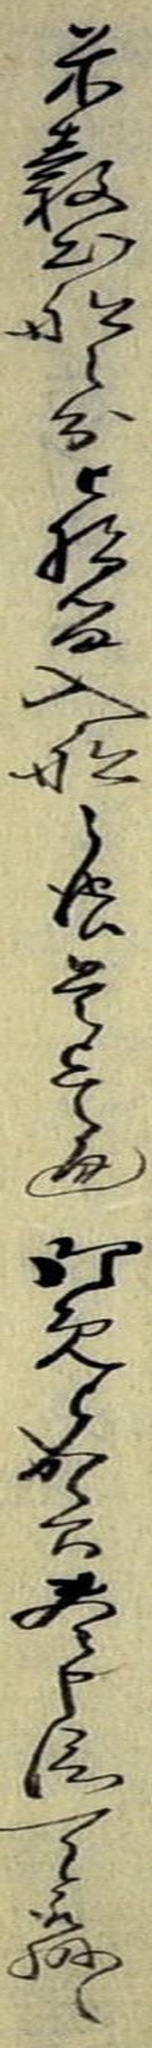米穀出舩之分被指留入舩之儀は是迄之通御免被成候間夫々申渡可被取扱候
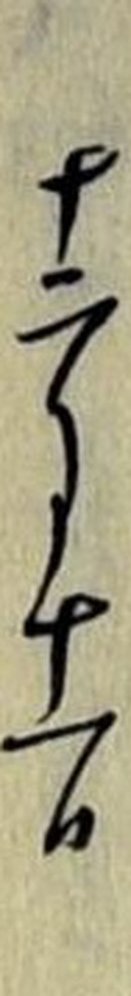十二月十一日
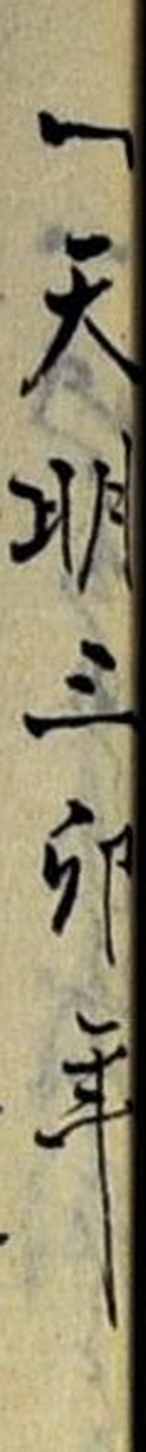一天明二寅年
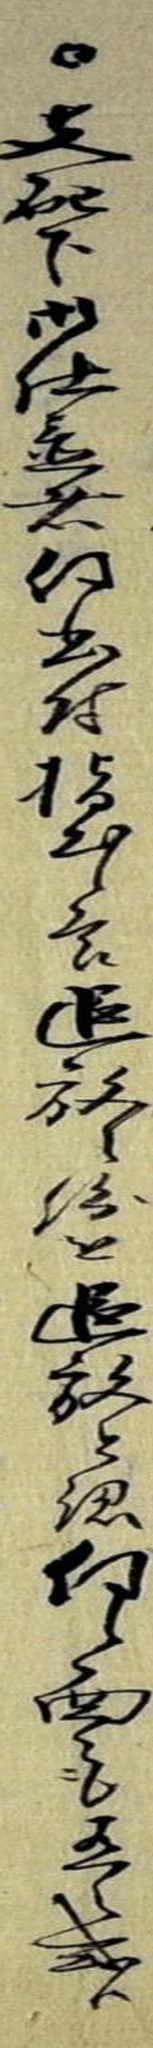〇支配下御仕置者伺書付指出候節追放之儀を追放と認伺候面々も有之或は
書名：命令之部 二
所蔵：福井県文書館 Fukui Prefectural Archives
